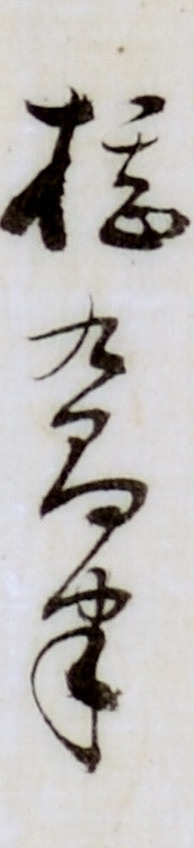椹九間半
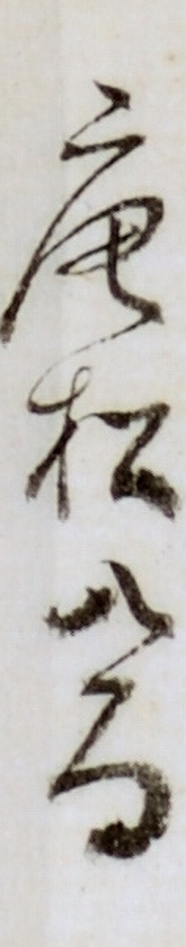唐松八間
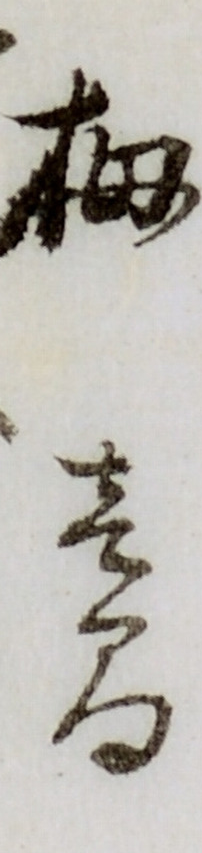栂壱間
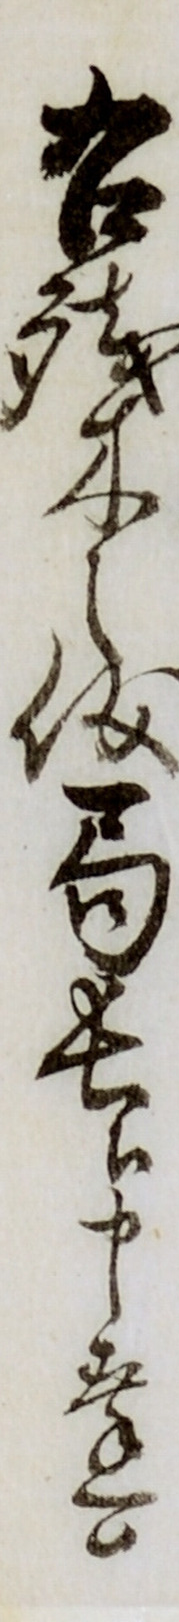右残木之儀局長え申達候
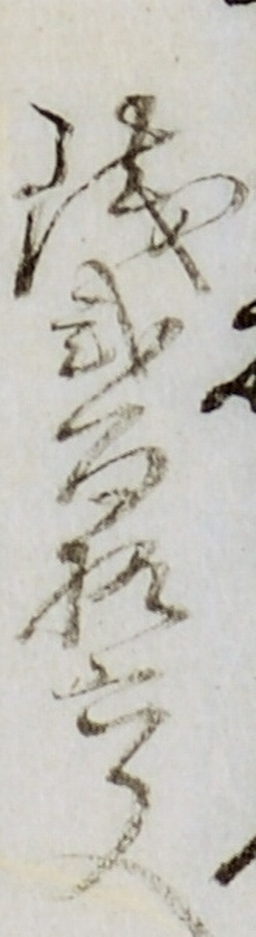銭弐百拾六文
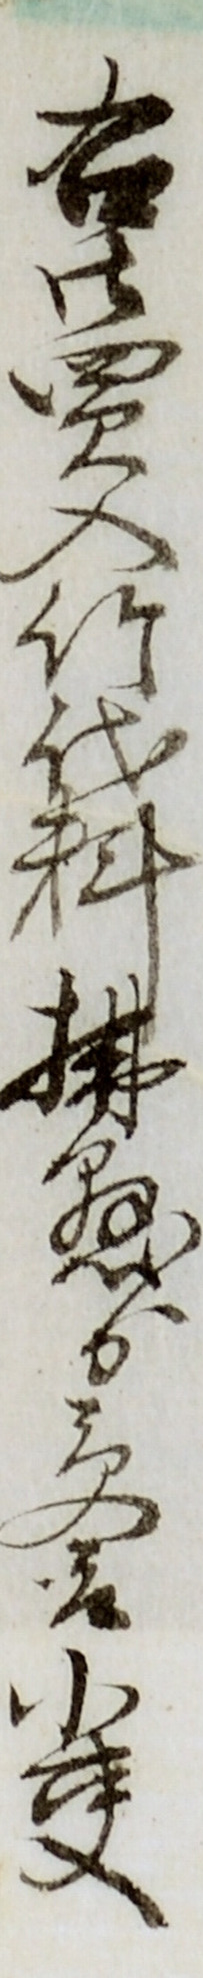右御買入竹代料払懸ゟ受取小吏
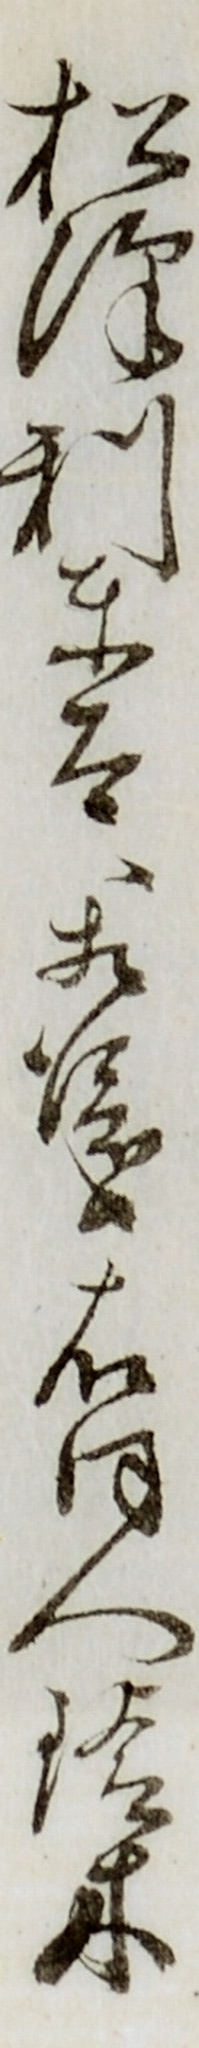松沢利東太へ相渡候右同人鈴木
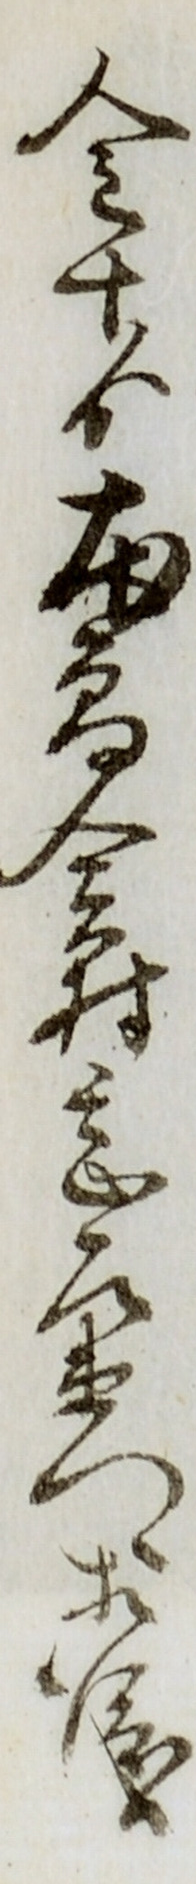金十ゟ本曽倉村甚左衛門へ相渡候
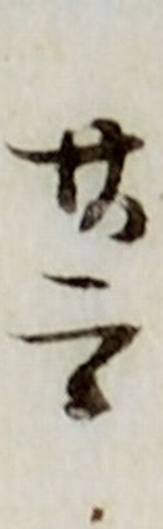廿二日
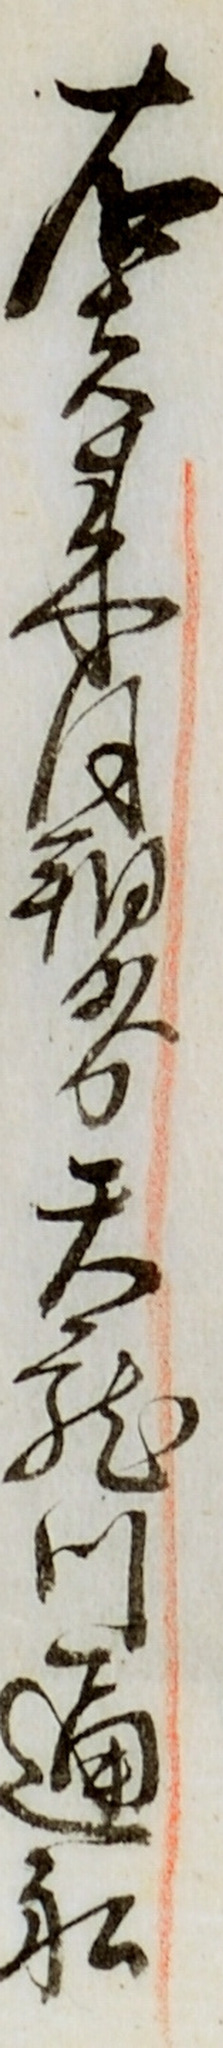右は来月朔日ゟ天龍川通船
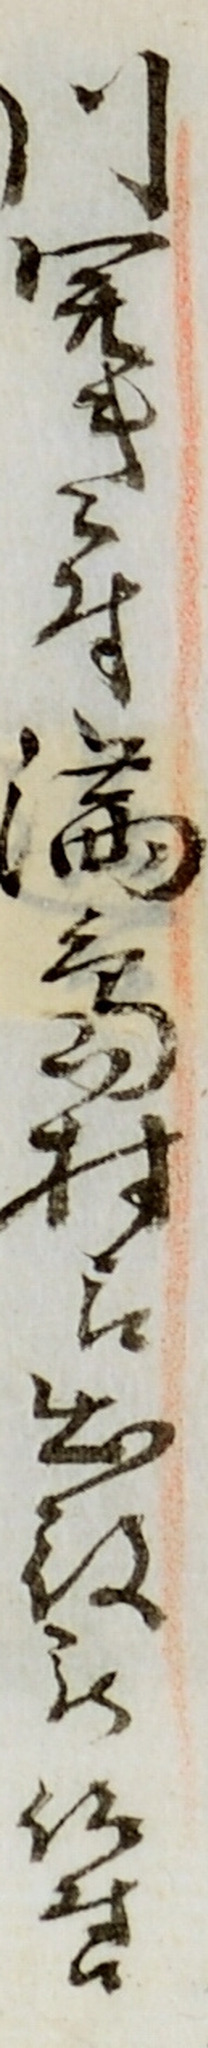川開きに付満島村え出役被仰出候
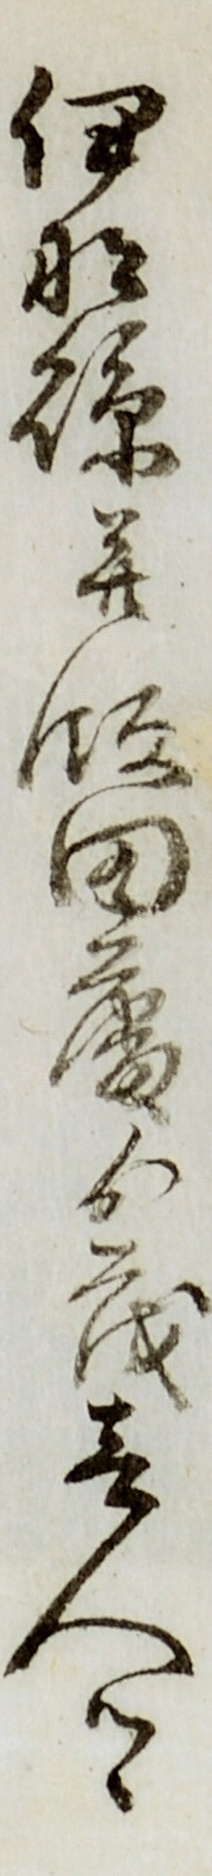伊那県幷飯田藩ゟも壱人ツヽ
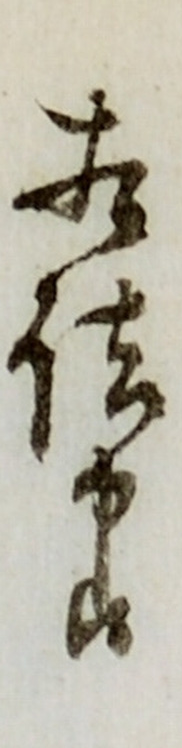相詰申候
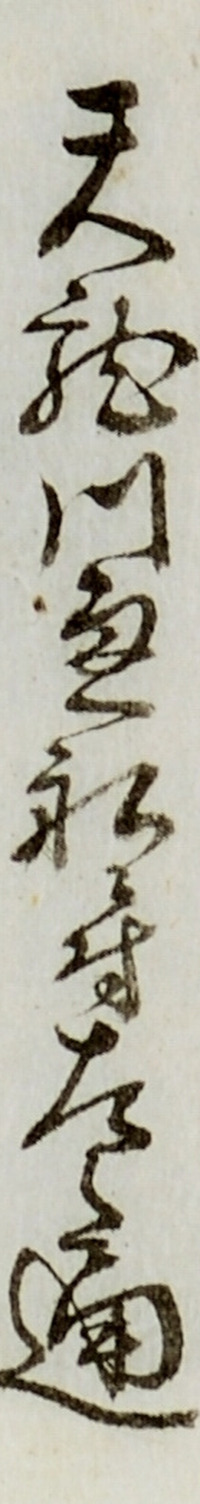天龍川通船に付左之通
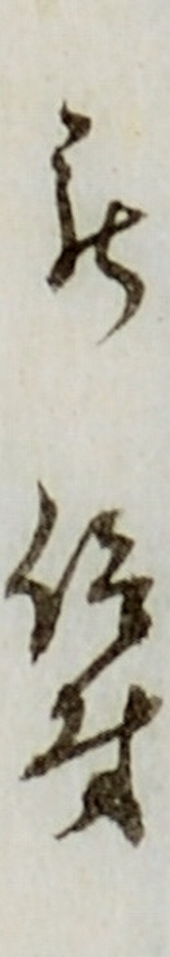被仰付
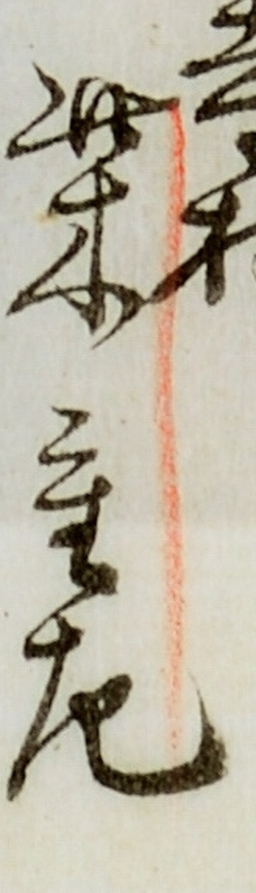柴重左
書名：山林方諸事御用留
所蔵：伊那市立高遠町図書館・合同会社AMANE
